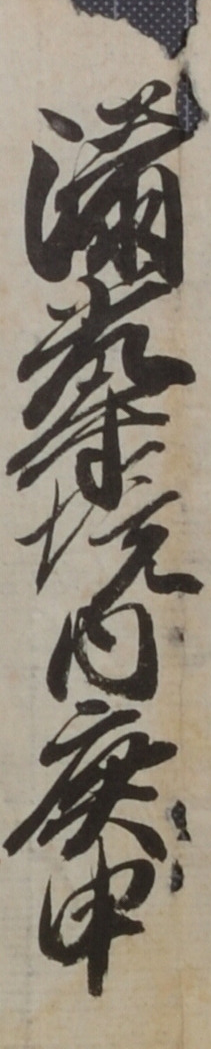満光寺境内庚申
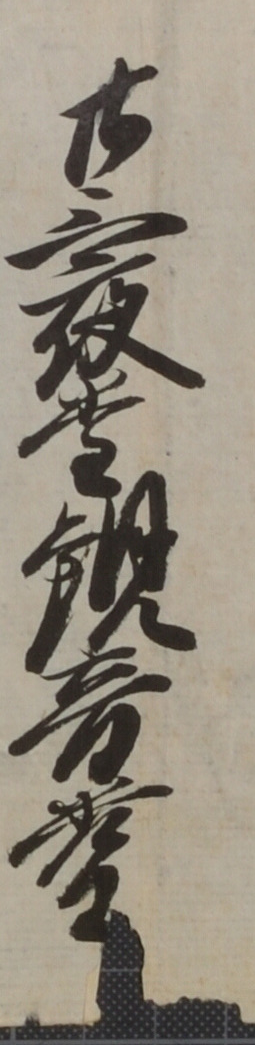廿三夜堂観音堂
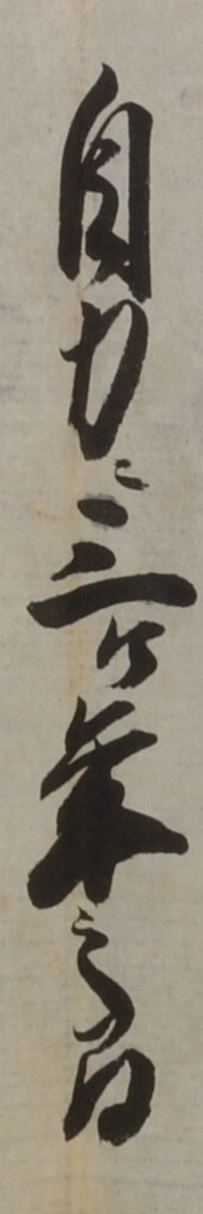自力ニ三ヶ年之間
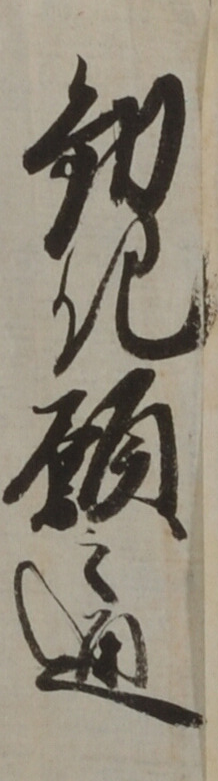勧化願之通
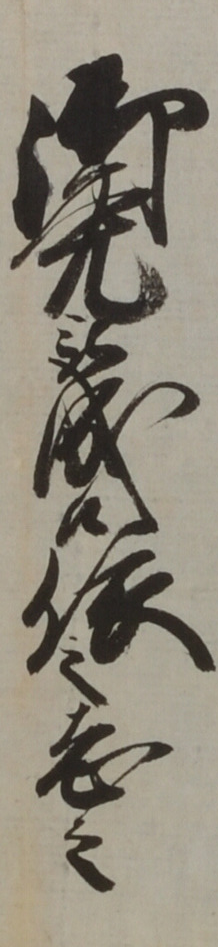御光被成候依之志之
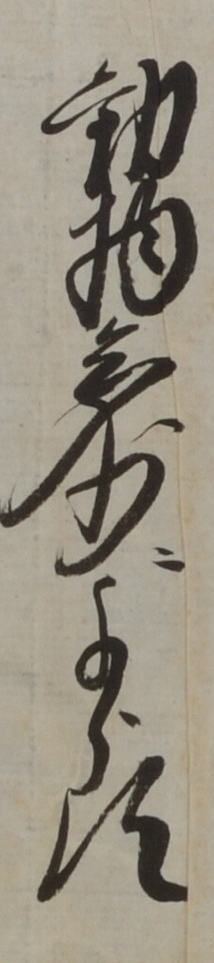勧物多少ニよらす
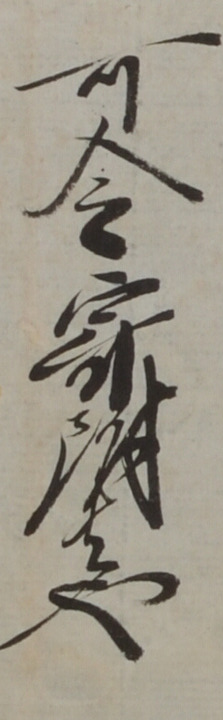可令寄附者也
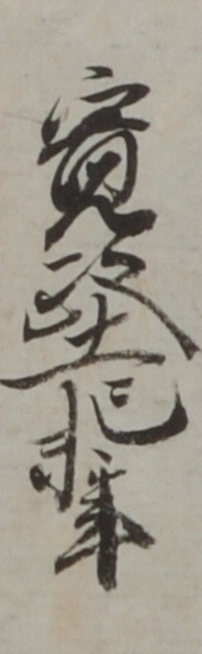寛政十一巳未年
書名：勧化免状
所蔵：伊那市立高遠町図書館・合同会社AMANE
